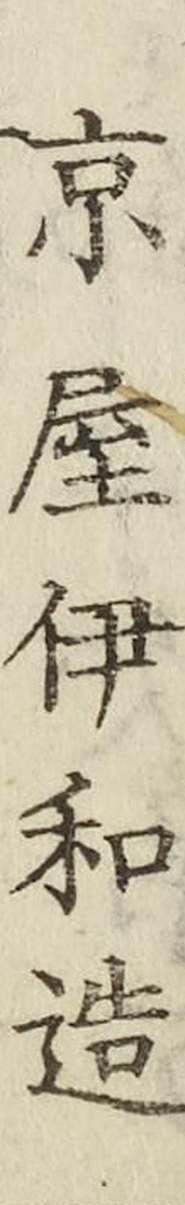京屋伊和造
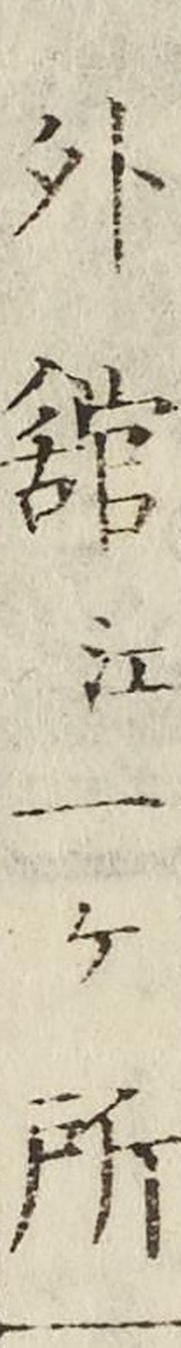外舘え一ケ所
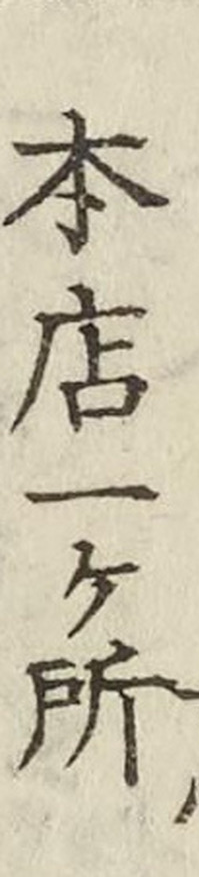本店一ケ所
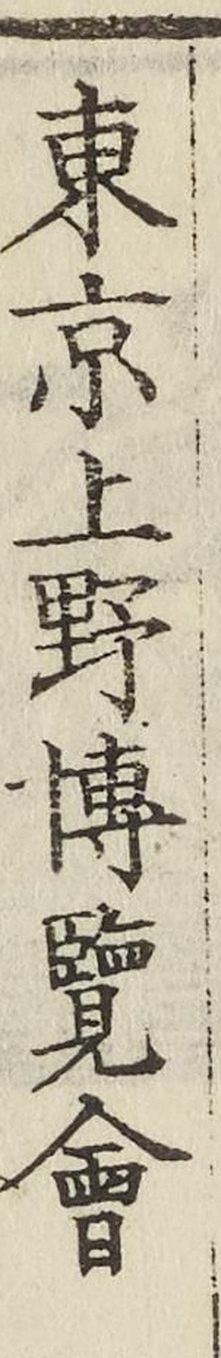東京上野博覧会
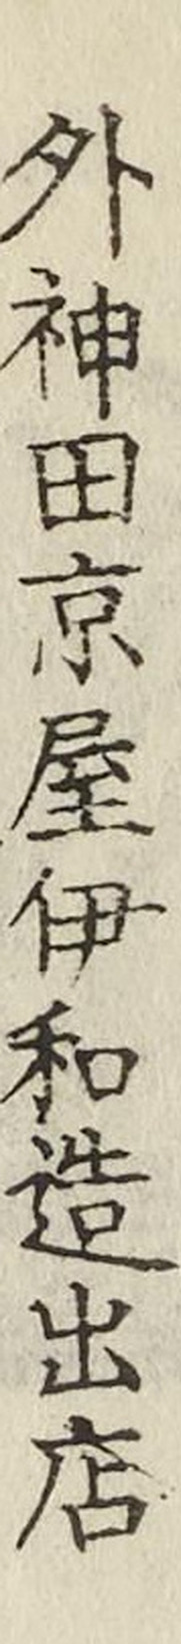外神田京屋伊和造出店
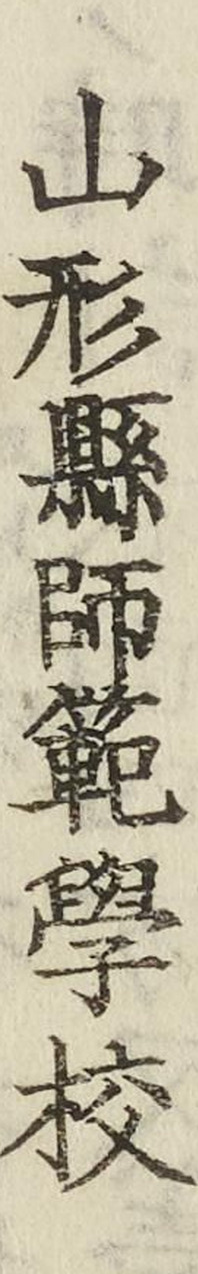山形県師範学校
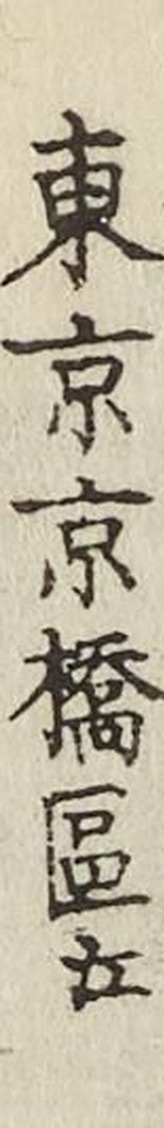東京京橋区え
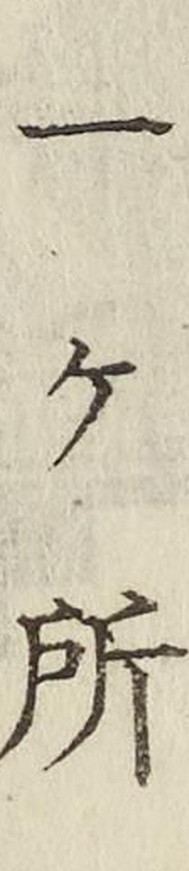一ケ所
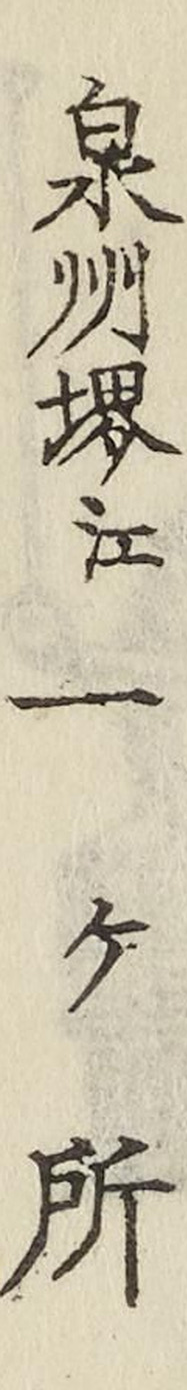泉州堺え一ケ所
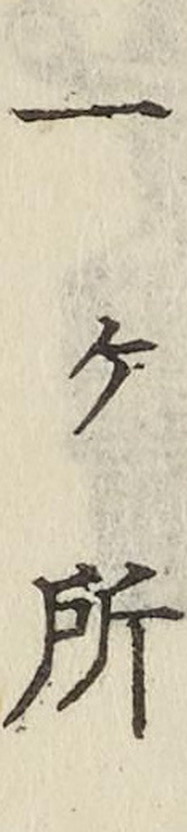一ケ所
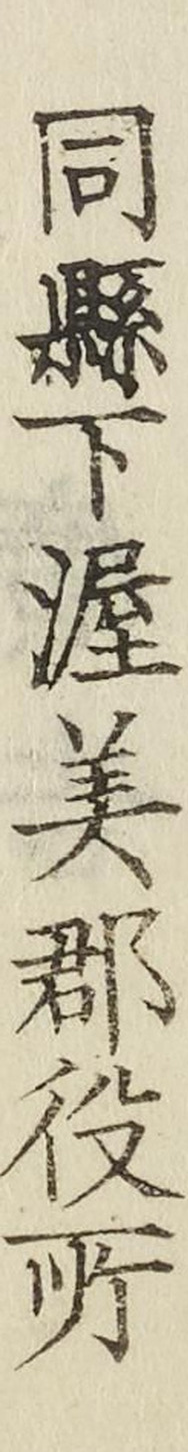同県下渥美郡役所
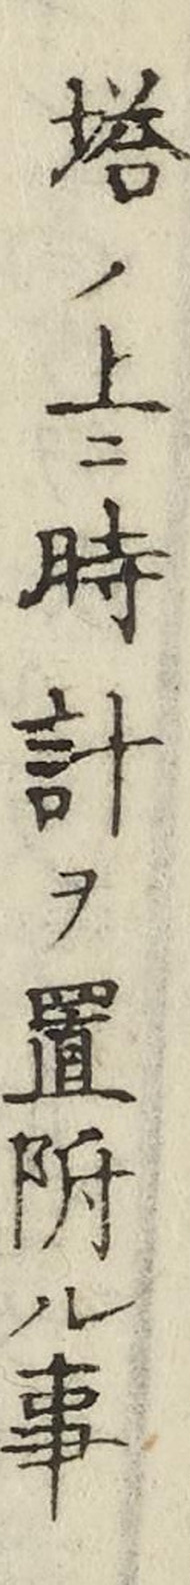塔ノ上ニ時計ヲ置付ル事
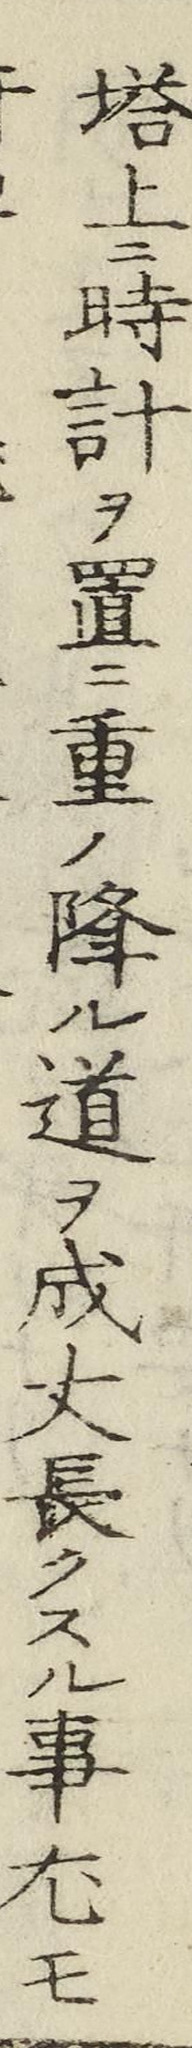塔上ニ時計ヲ置ニ重ノ降ル道ヲ成丈長クスル事尤モ
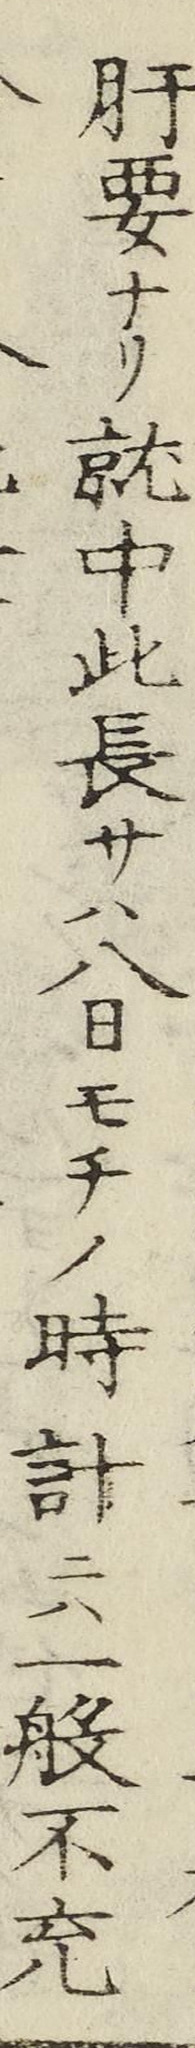肝要ナリ就中此長サハ八日モチノ時計ニハ一般不充
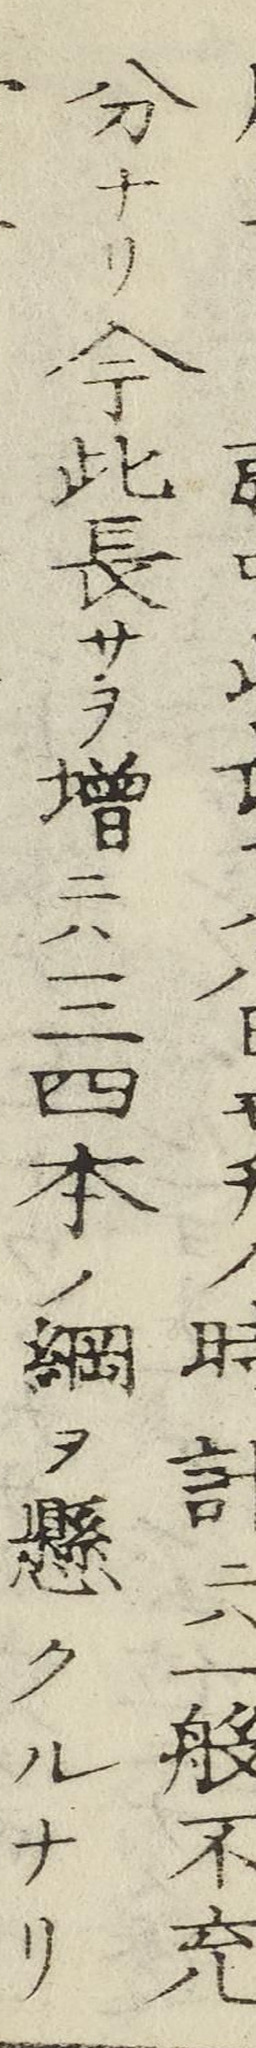分ナリ今此長サヲ増ニハ三四本ノ綱ヲ懸クルナリ
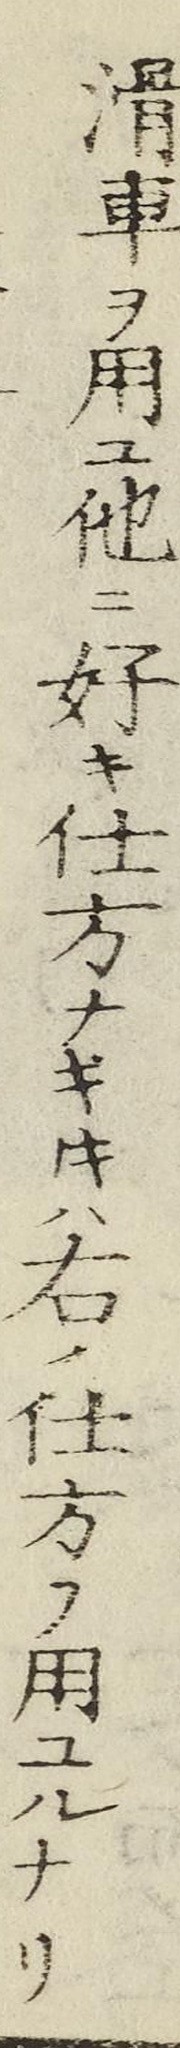滑車ヲ用ユ他ニ好キ仕方ナキトキハ右ノ仕方ヲ用ユルナリ
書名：[時計に関する冊子]
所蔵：東京大学地震研究所図書室 Earthquake Research Institute Library, The University of Tokyo, JAPAN
